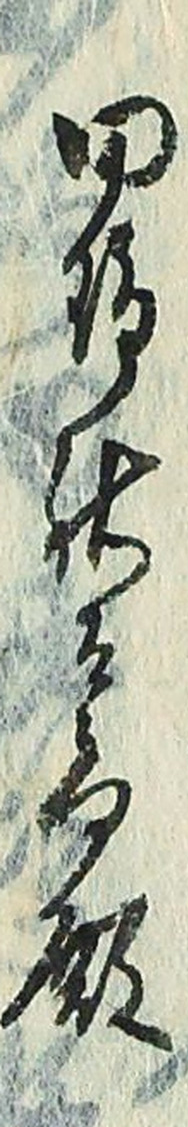田野祐太郎殿
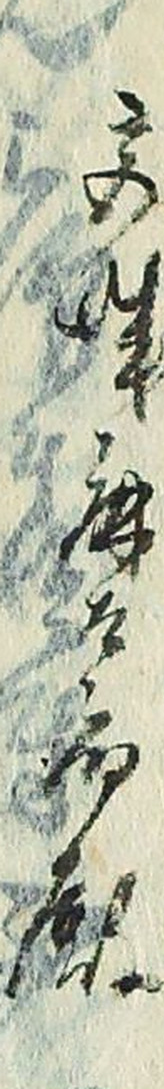宮城麻太郎殿
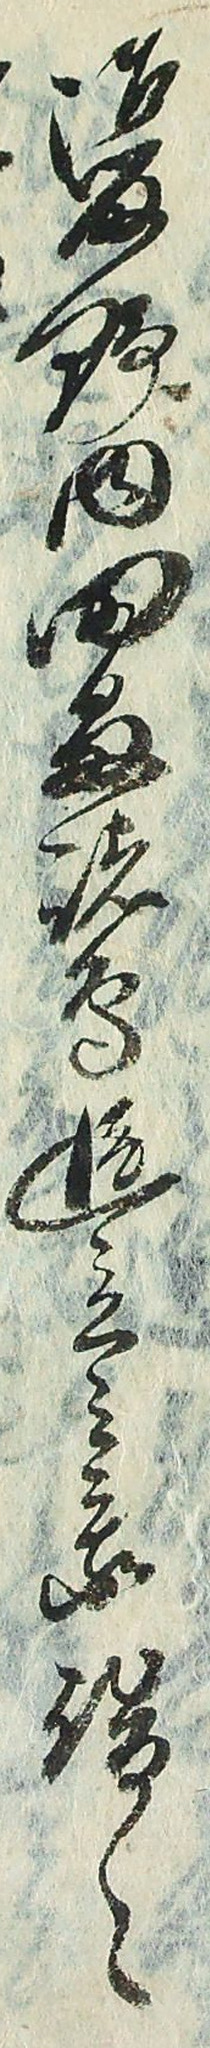御留野内田畠諸鳥追立之義端々
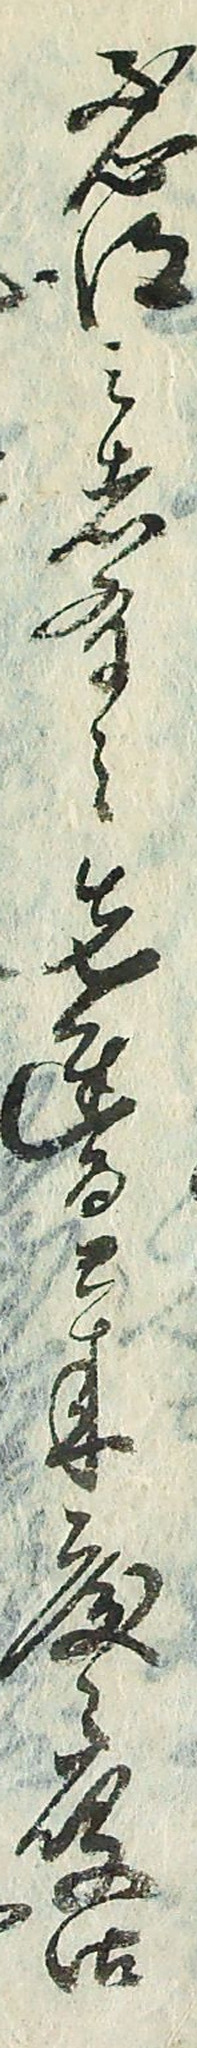不心得之者有之先達而已来度々厚御
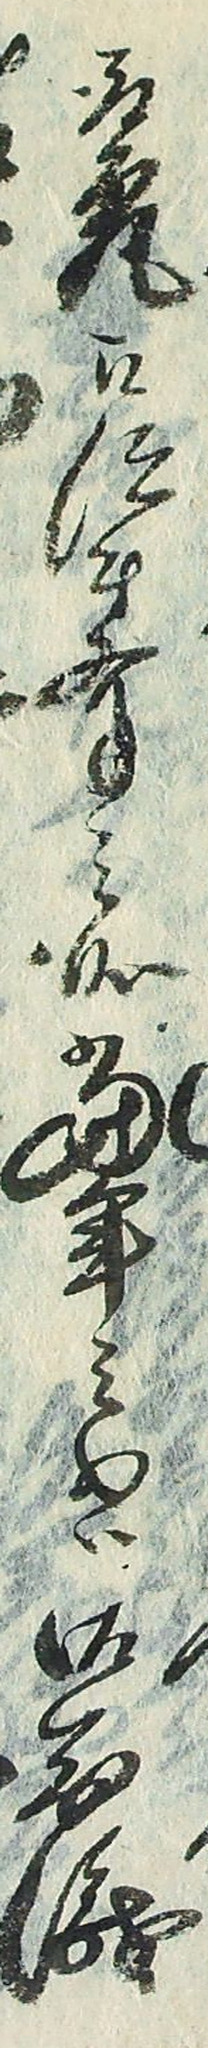取究被仰付有之所当年之義は御別儀
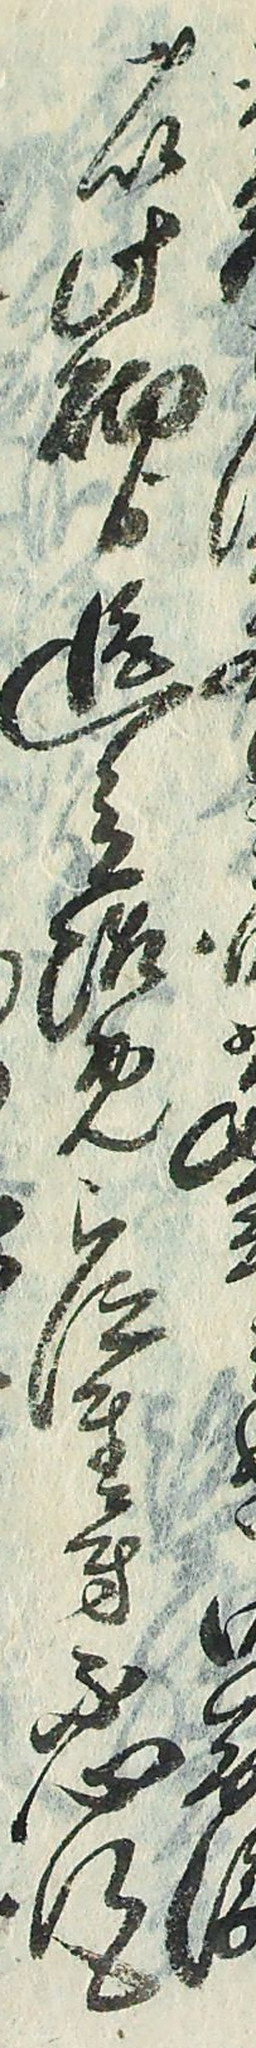を以此砌ゟ追立御免被仰付に付不心得
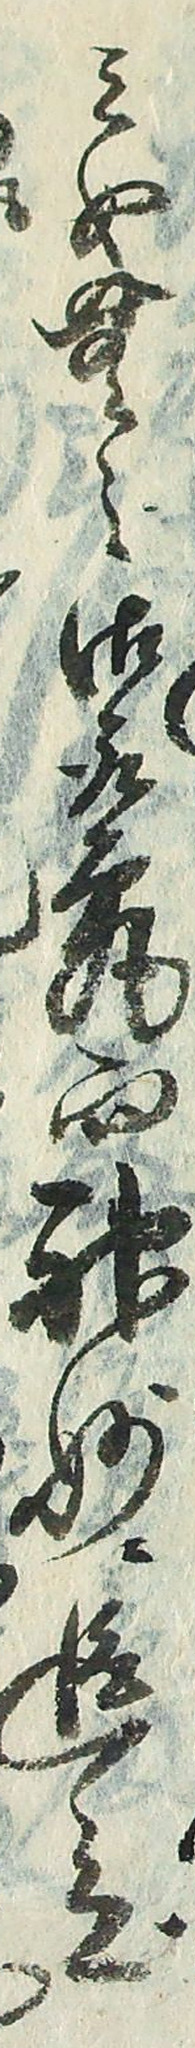之義無之御取究向神妙に追立
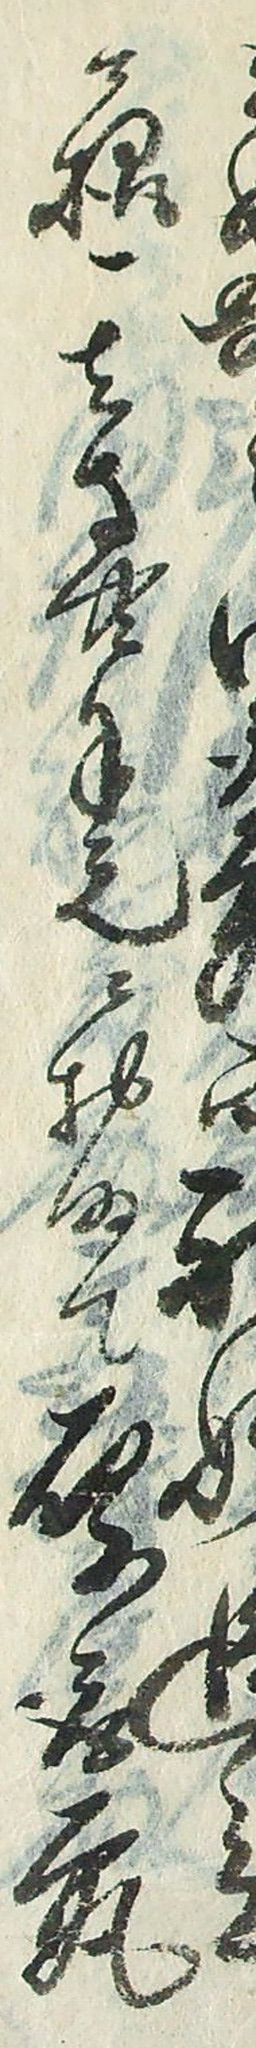候様其方共手元におゐて厚取究

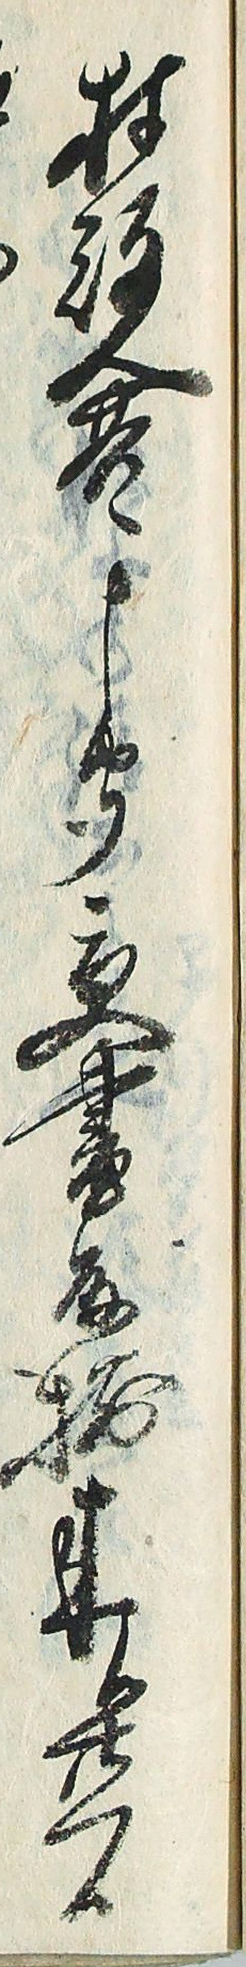村役人共へ申聞受書取揃来る廿一日
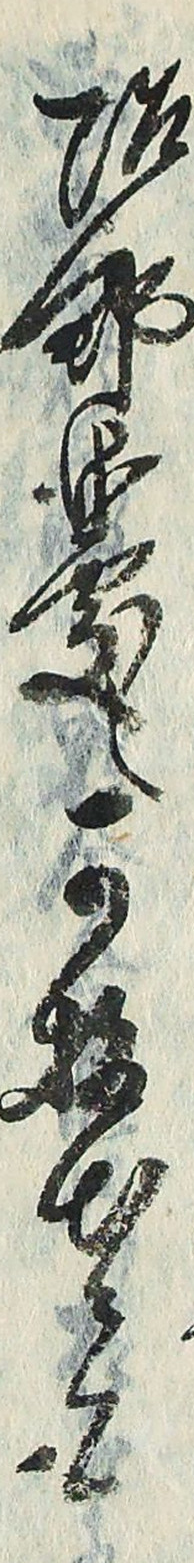御郡代処へ可指出候以上
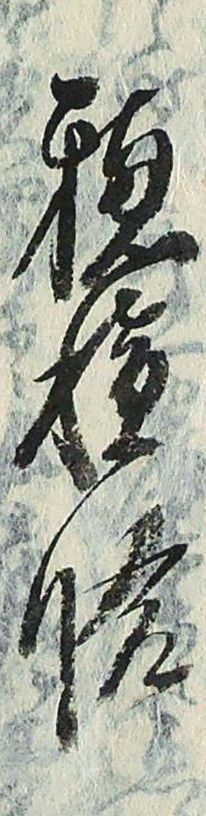穂積恰
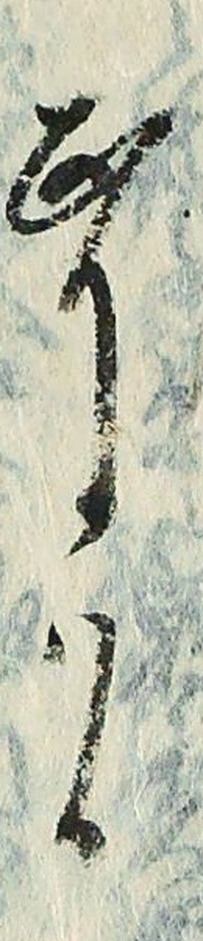正月八日
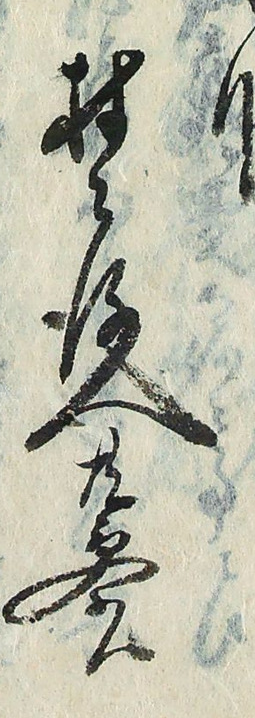村々役人共受書
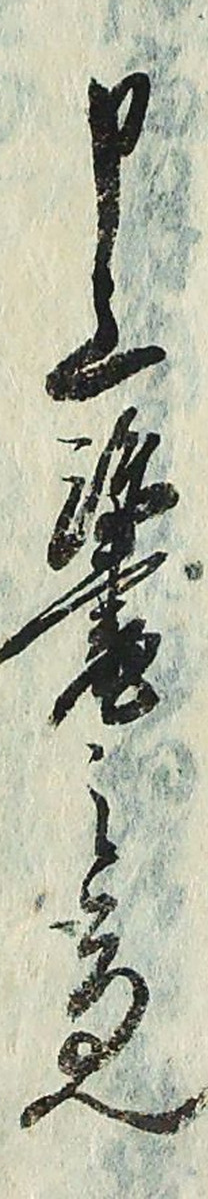申上添書之覚
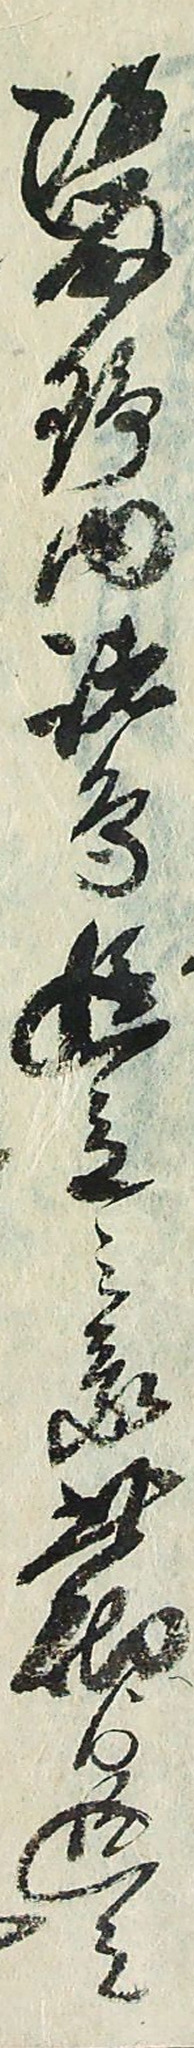御留野内諸鳥追立之義此砌ゟ追立
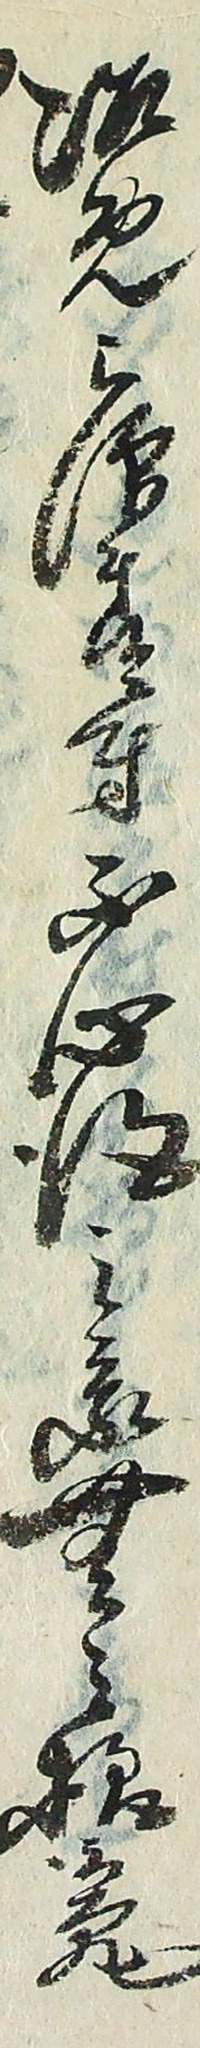御免被仰付候に付不心得之義無之様取究
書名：諸御用御□受書控
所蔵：鳴門教育大学 Naruto University of Education
